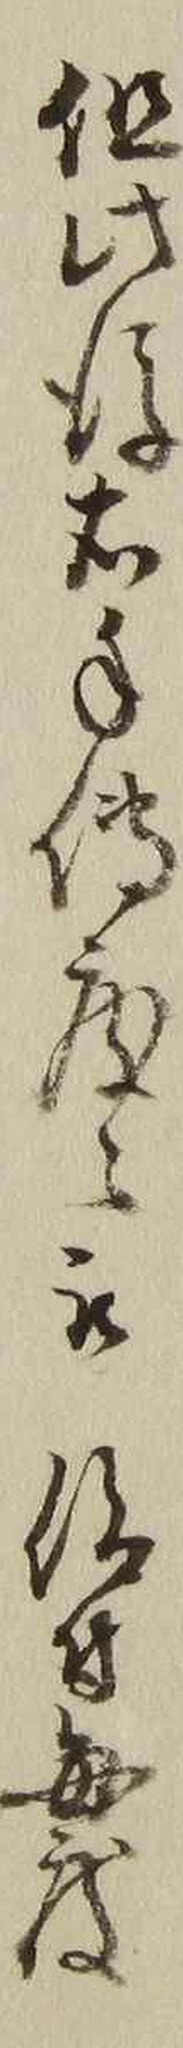但此後右手伝度々被仰付毎度
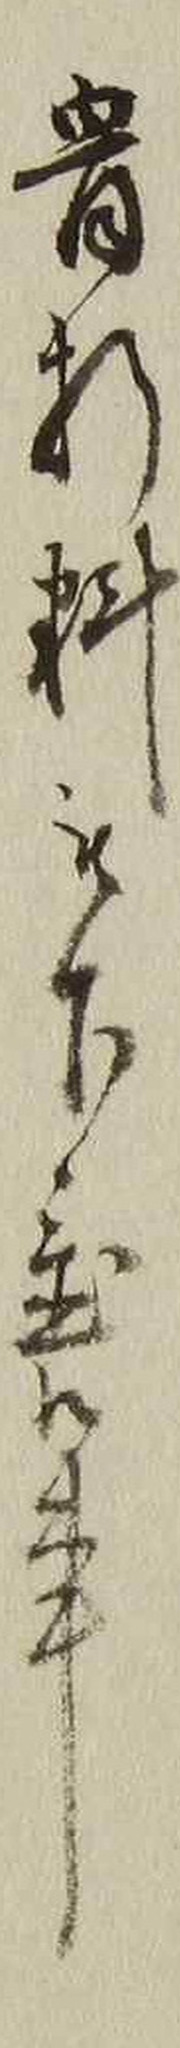骨折料被下置候事
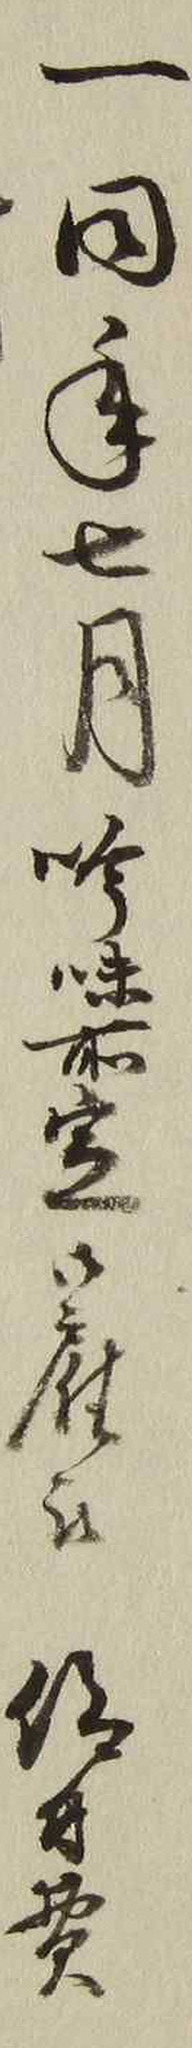一同年七月吟味所定御雇被仰付費
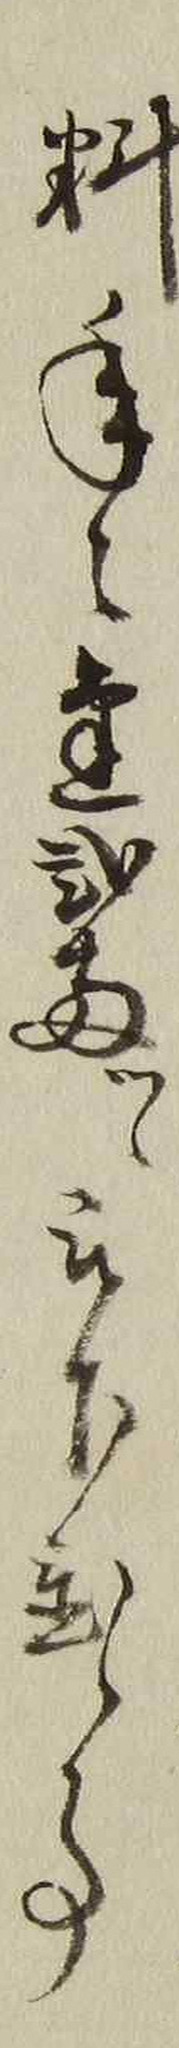料年々金弐両ツヽ被下置候事
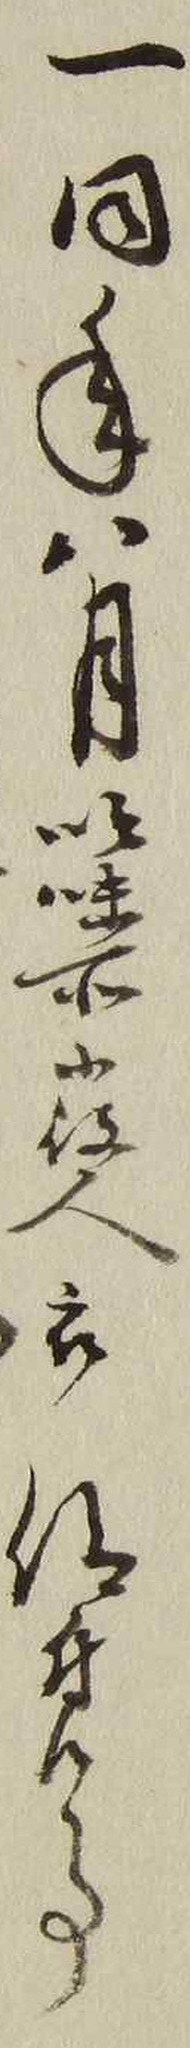一同年月八吟味所小役人被仰付候事
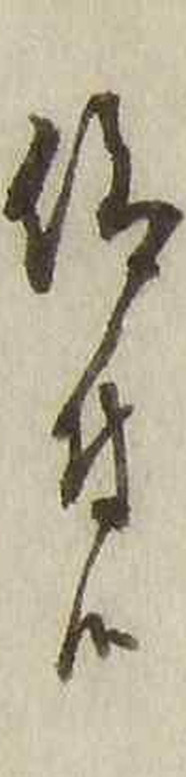仰付候

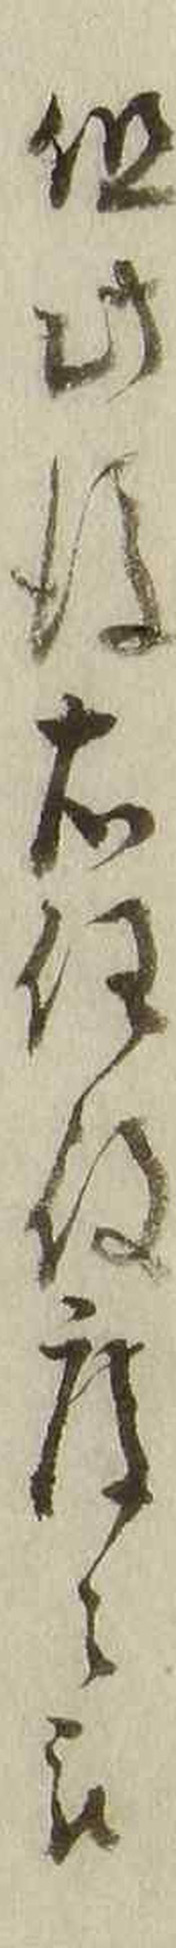但此後右任役度々被仰付毎
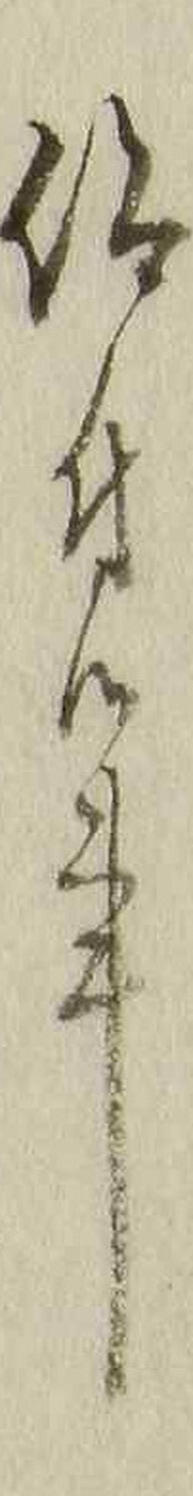仰付候事
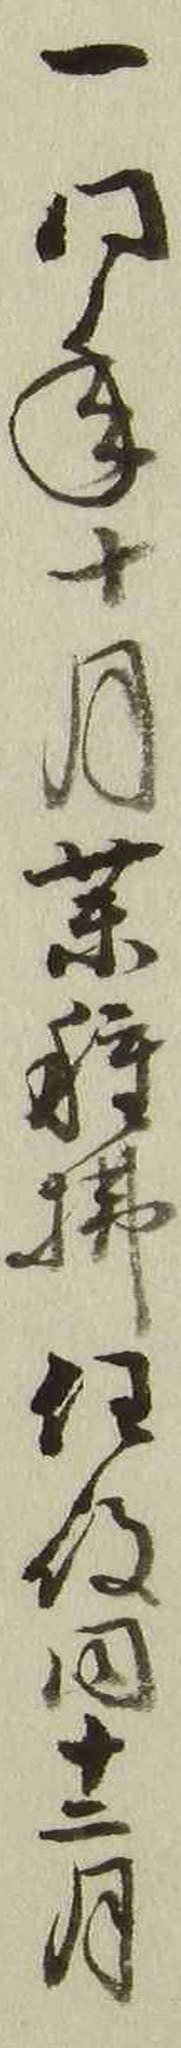一同年十月薬種払任役同十二月
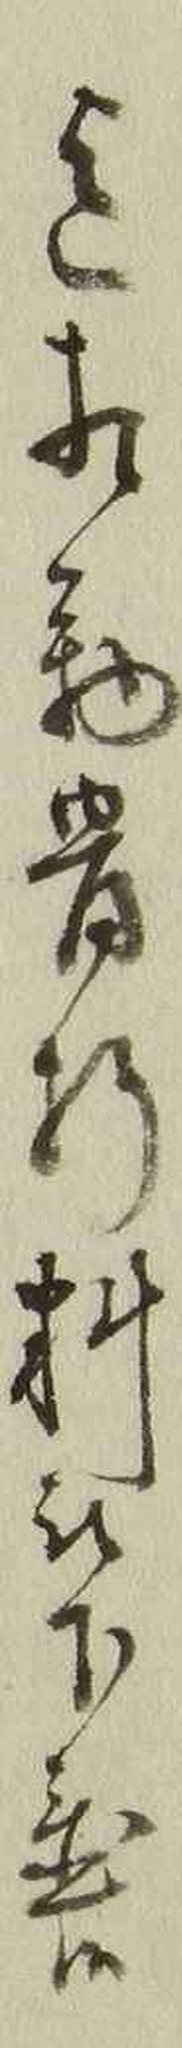迄相勤骨折料被下置候
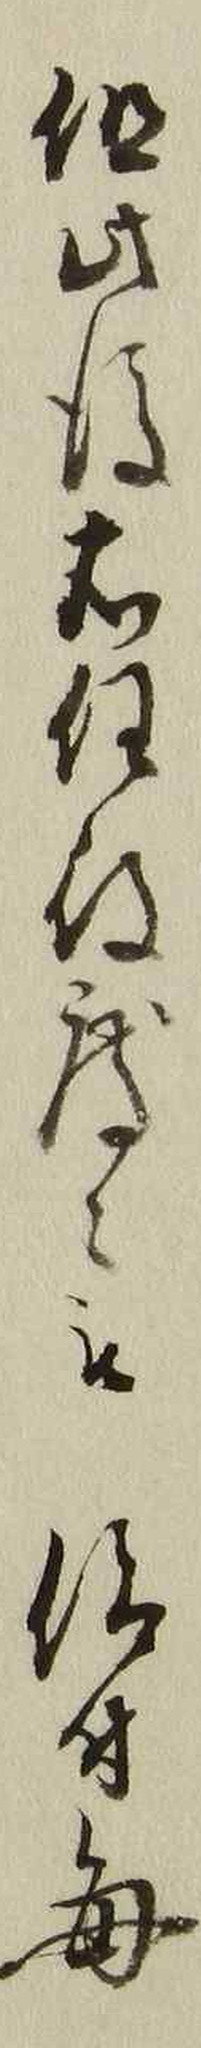但此後右任役度々被仰付毎
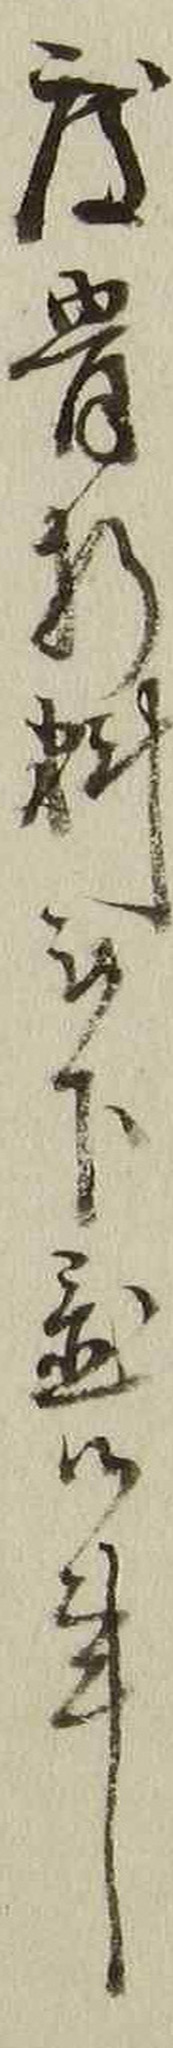度骨折料被下置候事
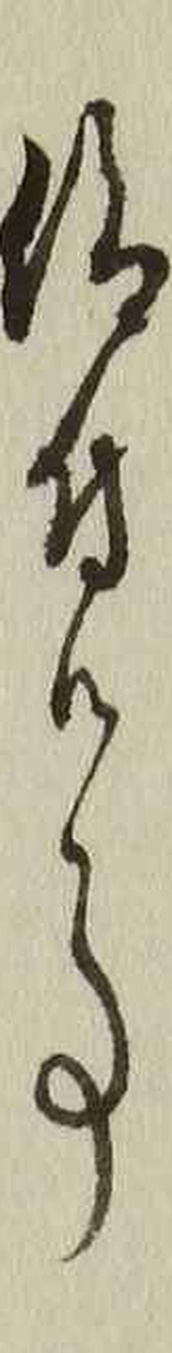仰付候事
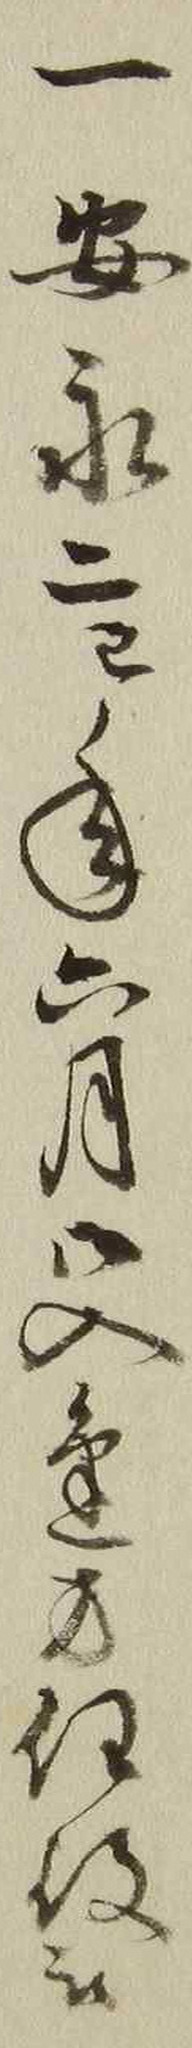一安永二巳年六月御入金方任役被
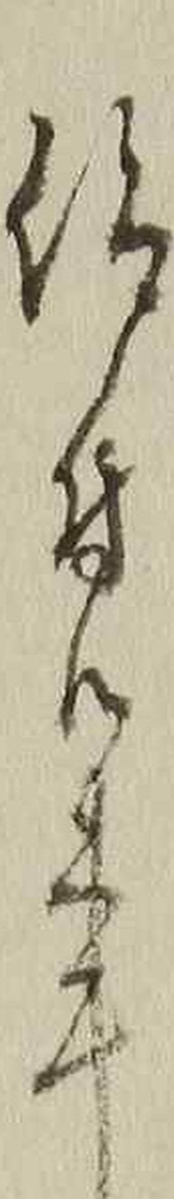仰付候事
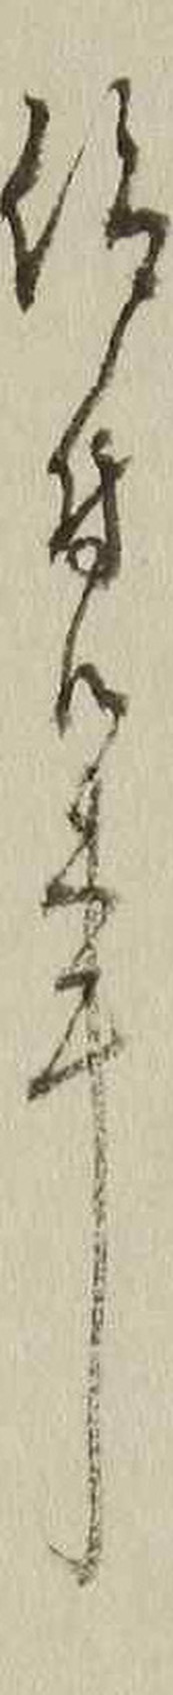仰付候事
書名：諸士系譜　巻之39　は之部7
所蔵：会津若松市立会津図書館
